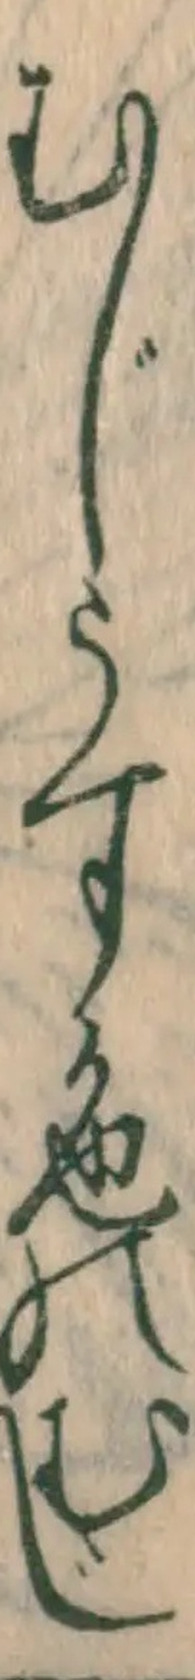むじうす色のむじ
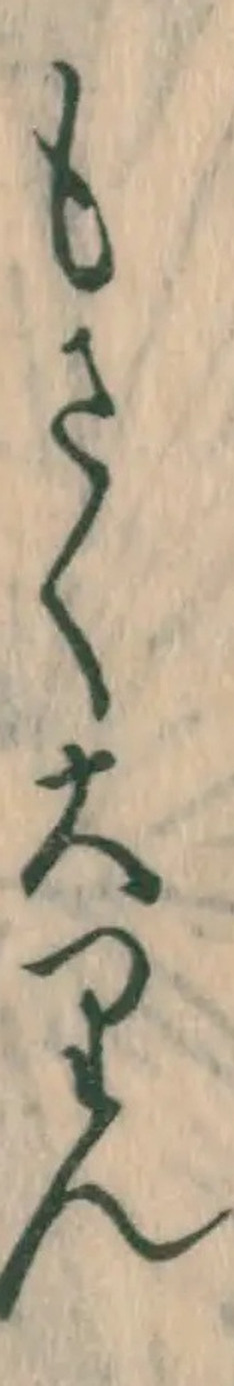もさく大りん
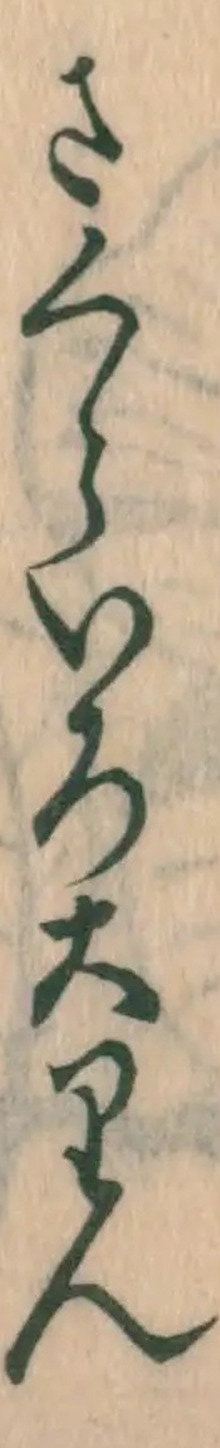さくらいろ大りん
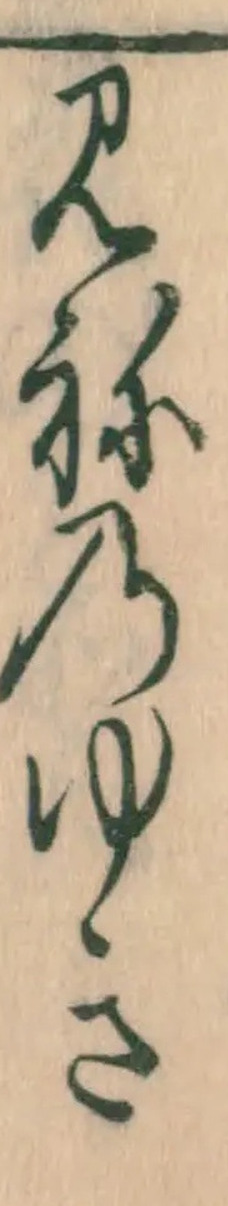みねのゆき
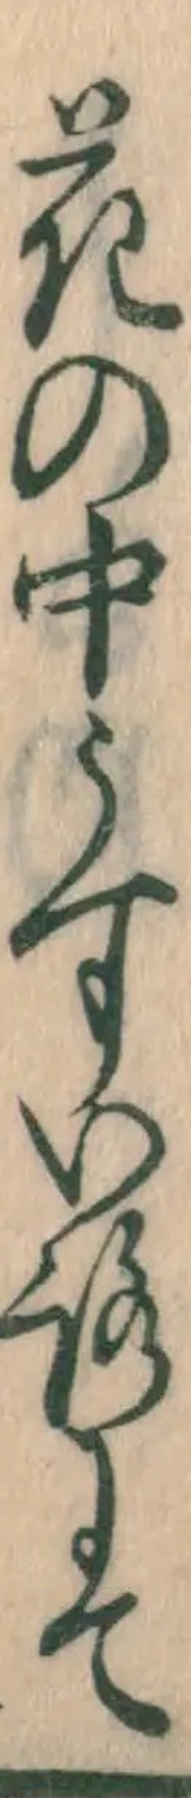花の中うすいろにて
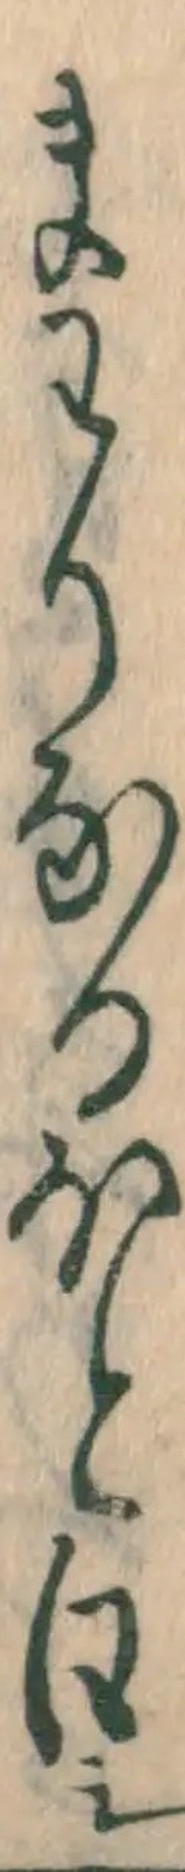まわりなるほと白
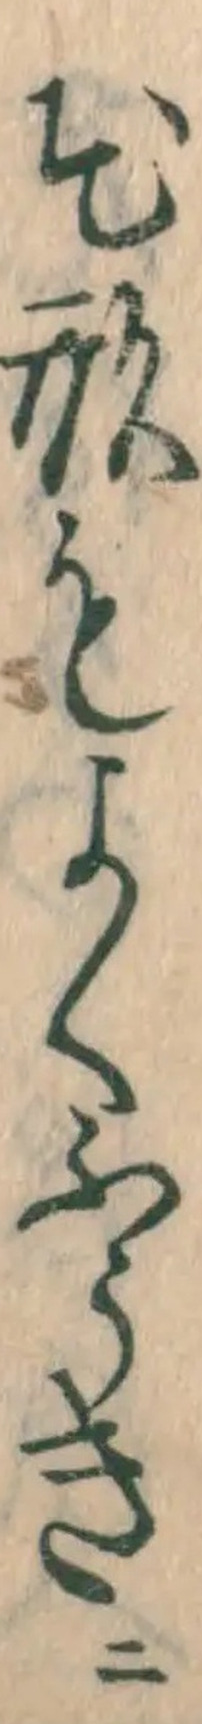花形もよくふうき

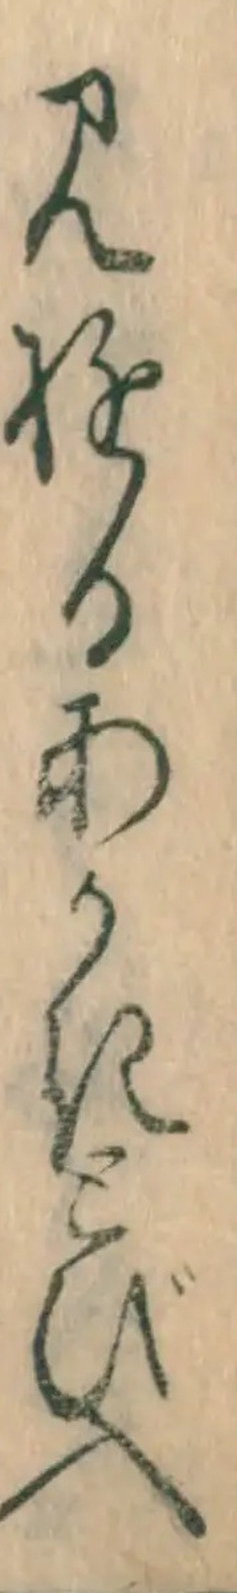見ゆるあかきとび入
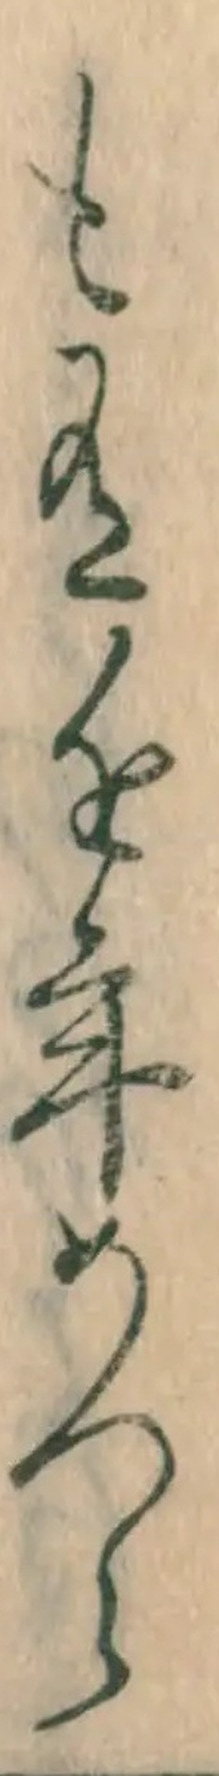も有近年めつら
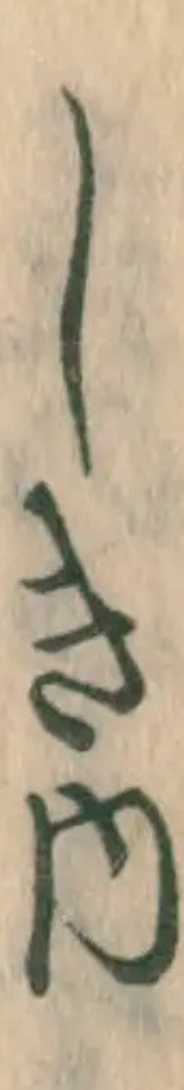しき内
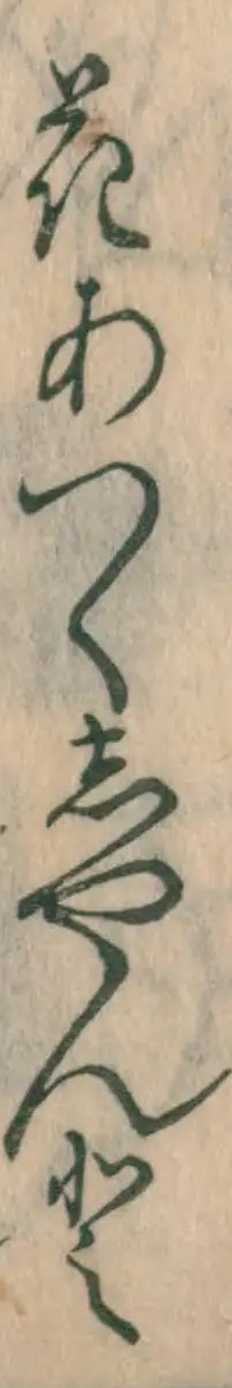花あつくしやんと
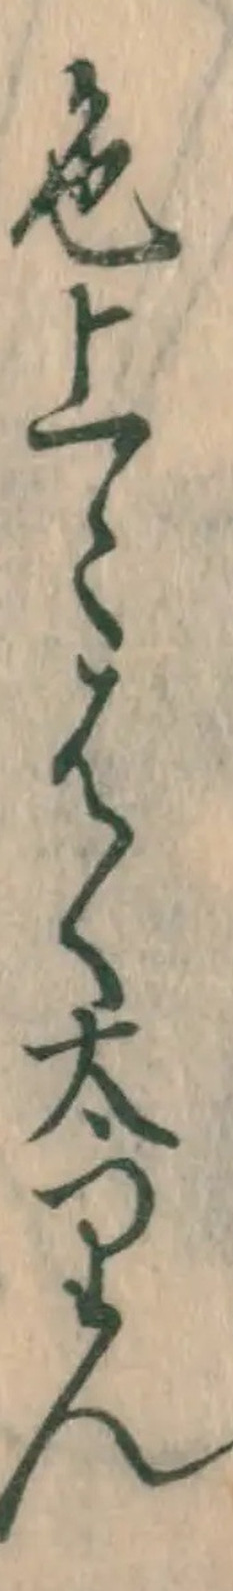色上こはく太りん
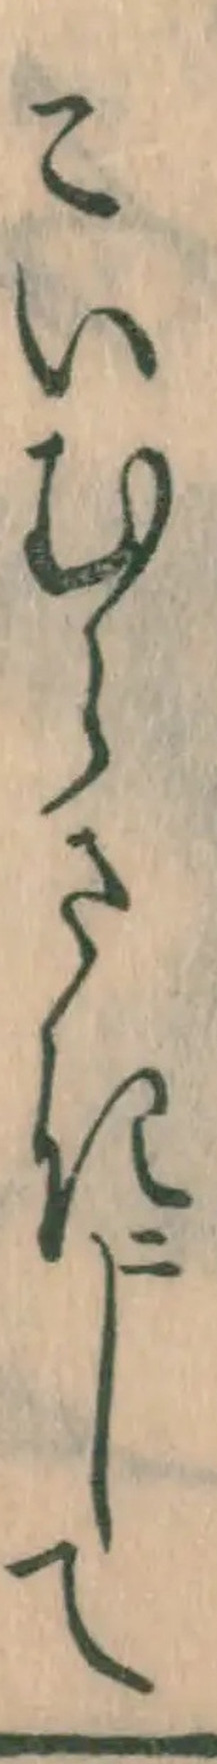こいむらさき
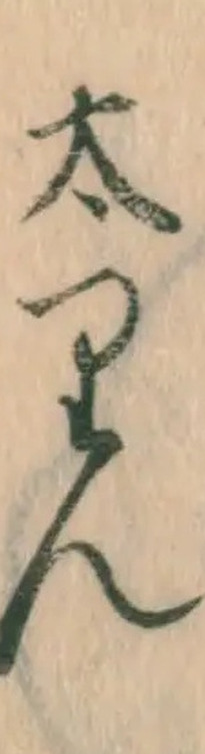太りん
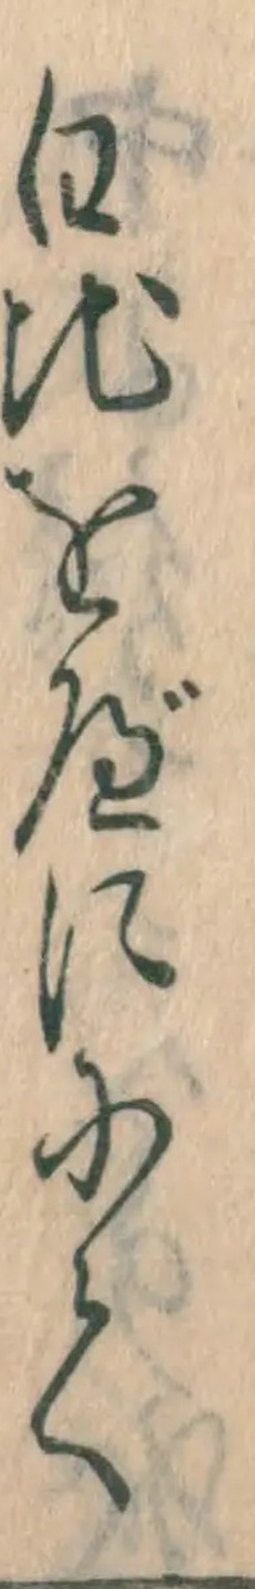白地をべににて
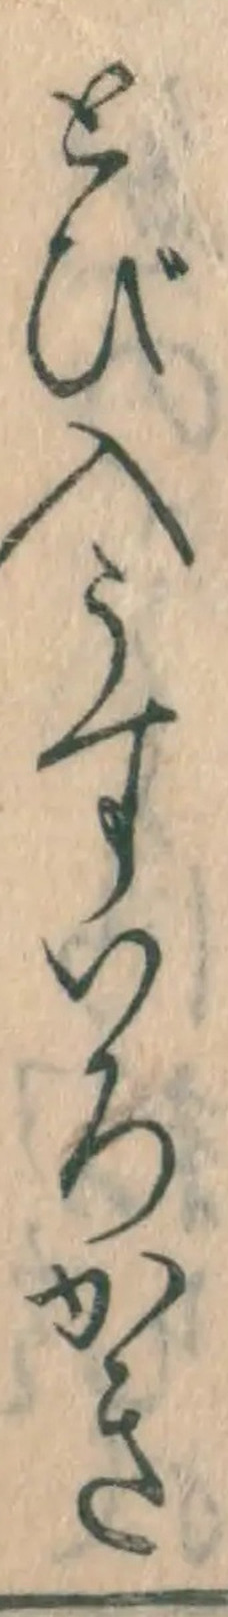とび入うすいろかき
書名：錦繍枕 5巻. [5]
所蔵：国立国会図書館 National Diet Library, JAPAN
